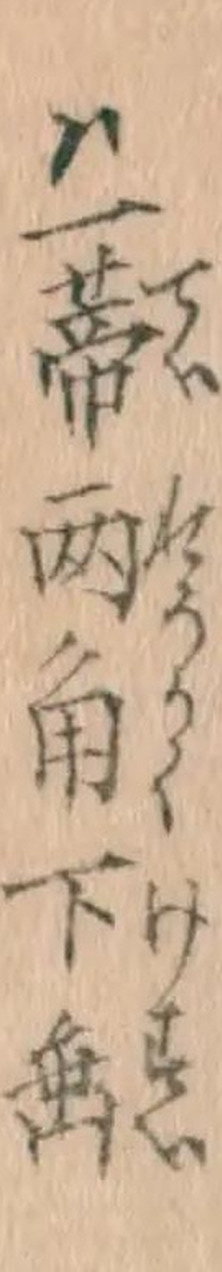は一蒂両角下垂
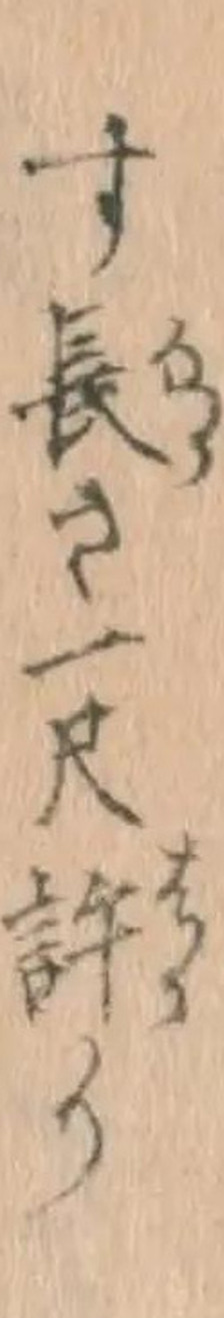す長さ一尺許り
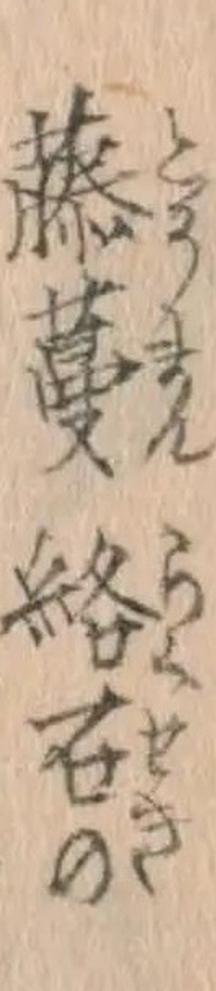藤蔓絡石の
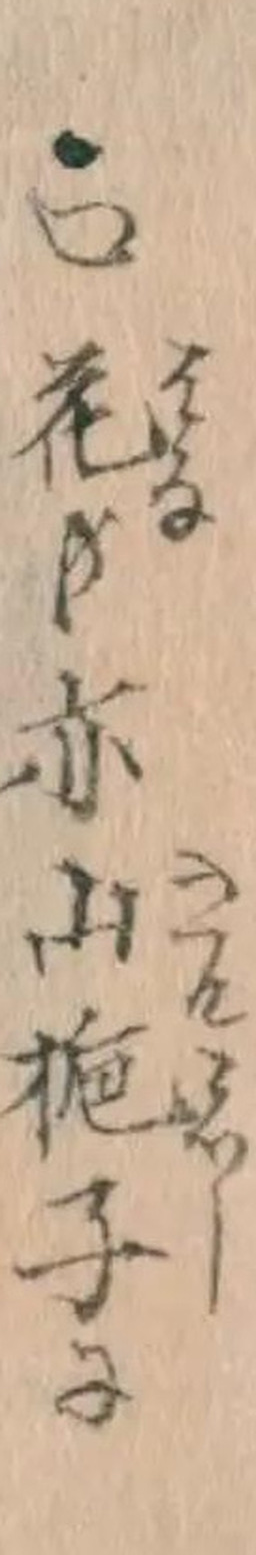●花も亦山梔子に
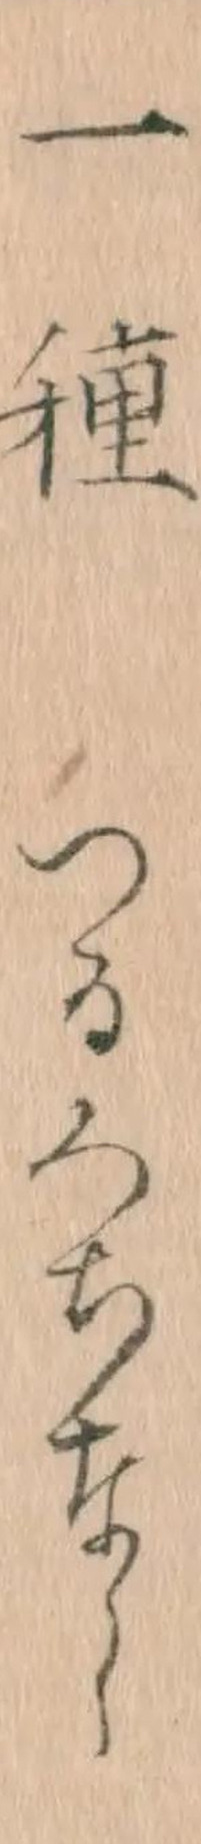一種つるくちなし
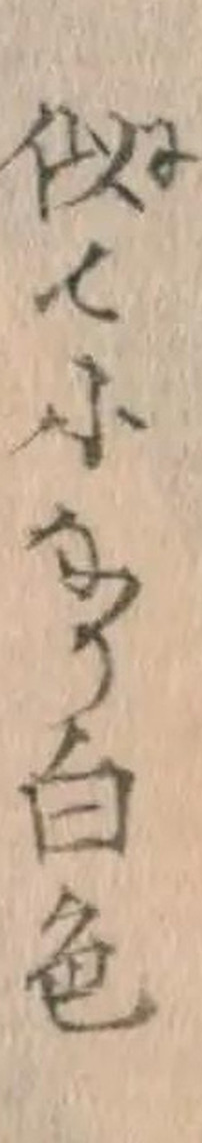似て小なり白色
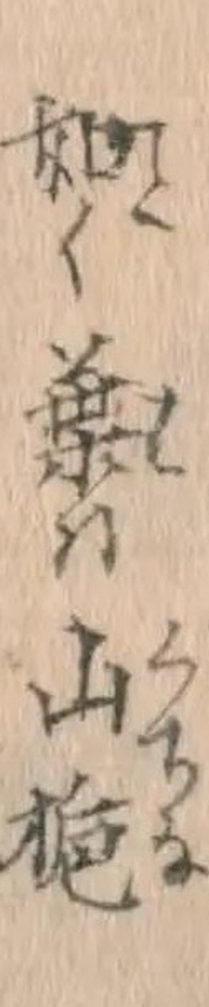如く葉は山梔
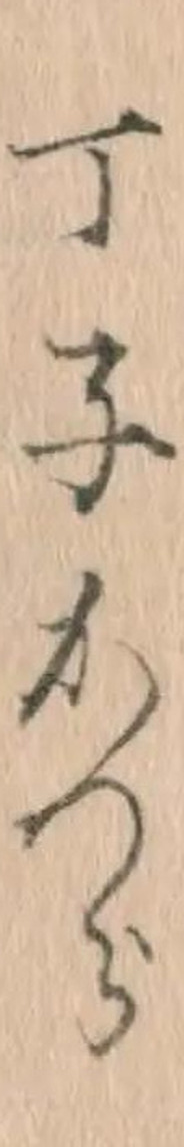丁子かつら
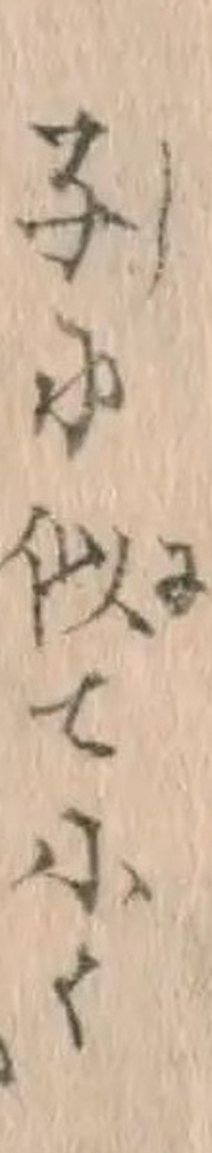子に似て小く
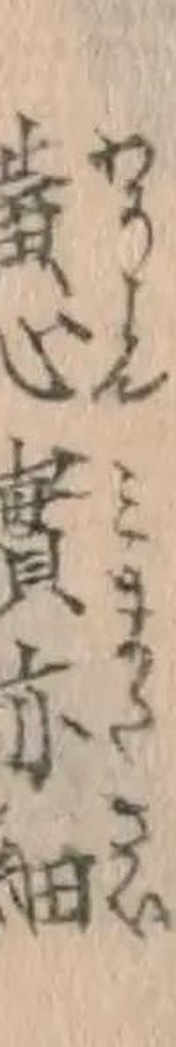黄心実亦細
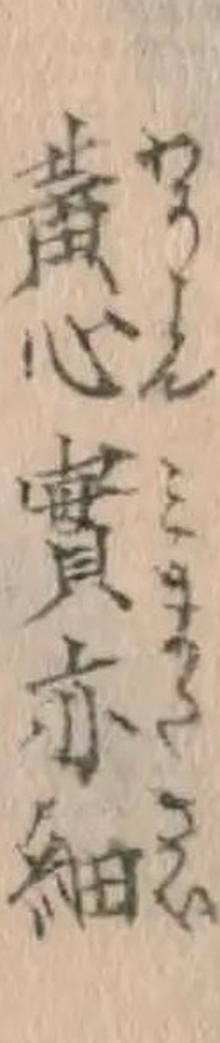黄心実亦細
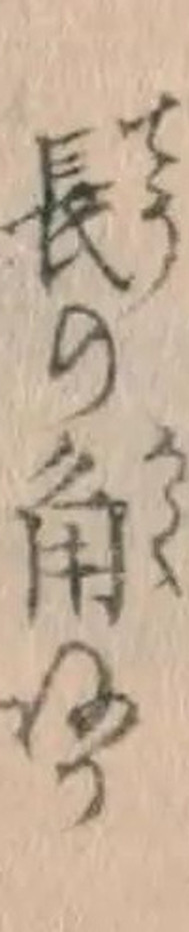長の角あり
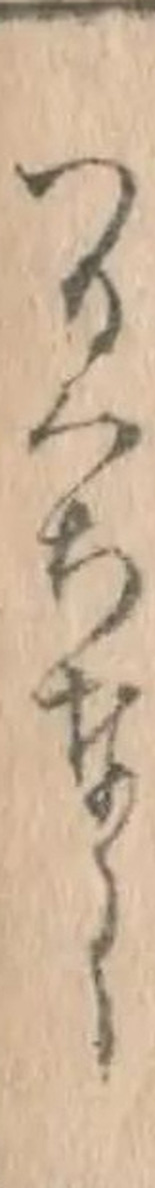つるくちなし

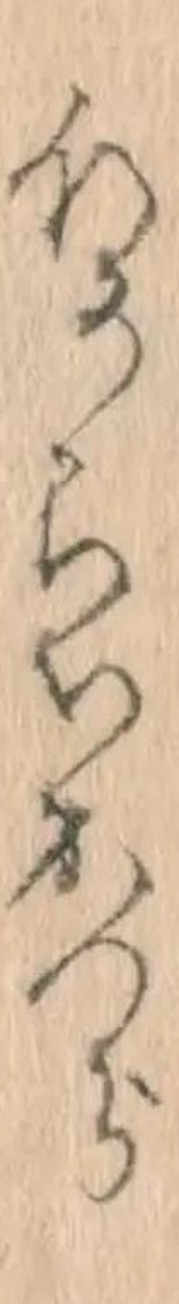ほうらいかつら
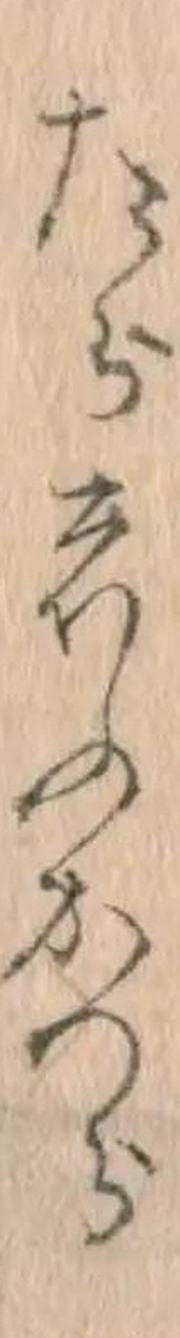たらはのかつら
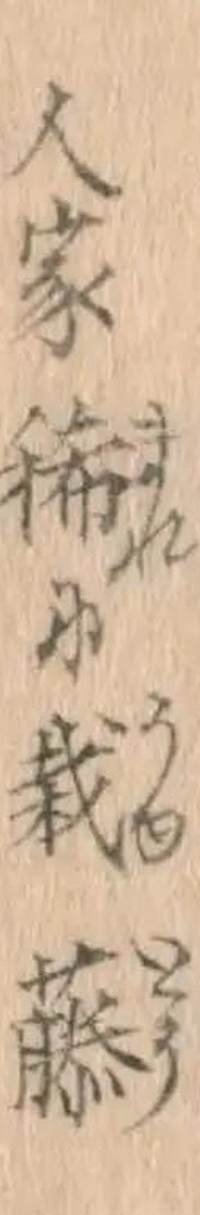人家稀に栽藤
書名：本草図譜. 巻31-33
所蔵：国立国会図書館 National Diet Library, JAPAN
